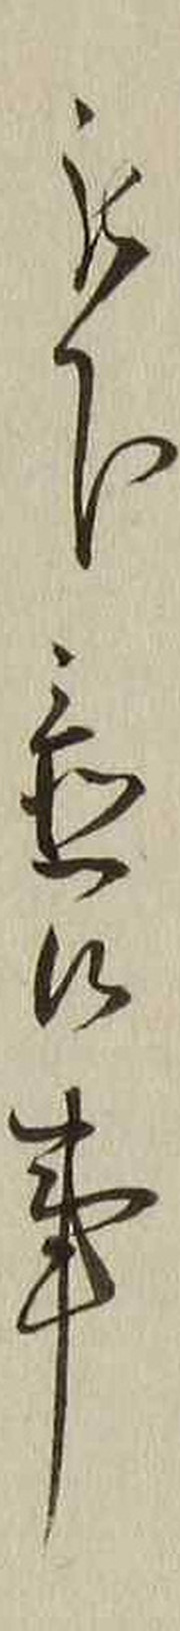被下置候事
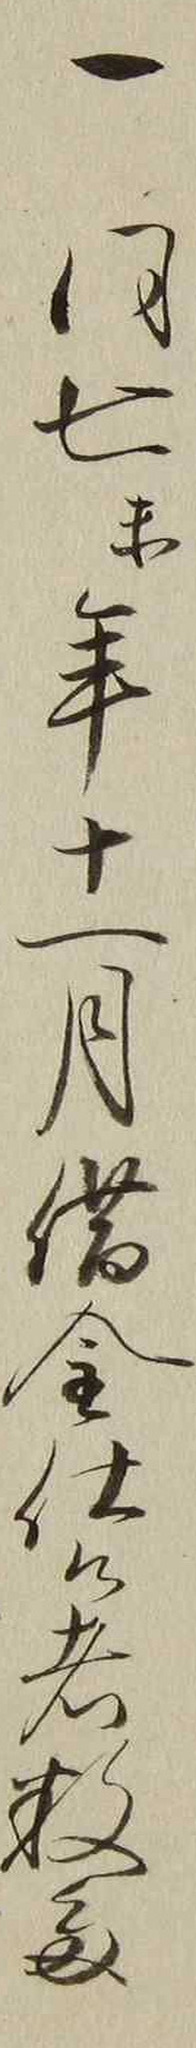一同七未年十一月借金仕候者数多
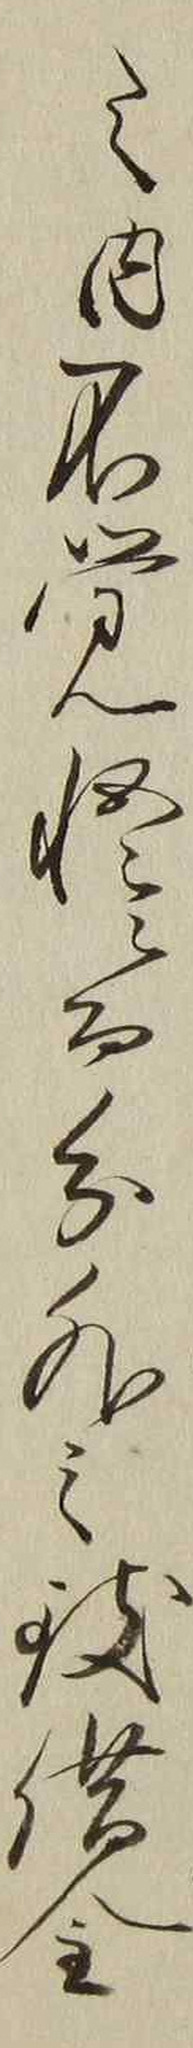之内不覚悟に而分外之致借金
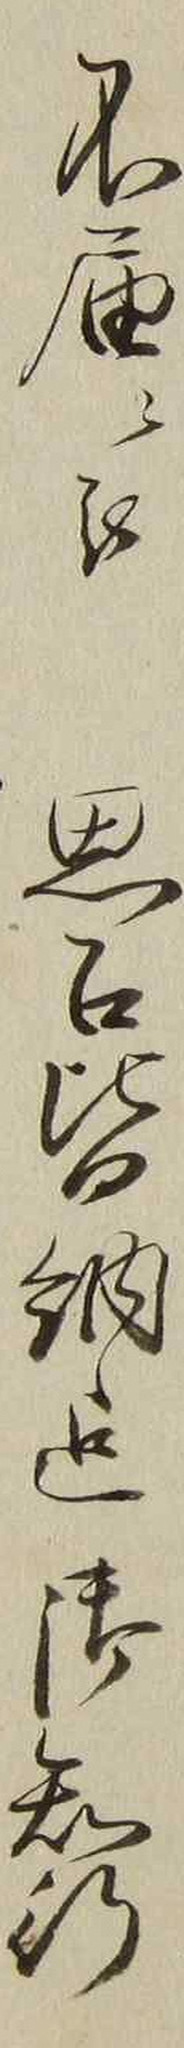不届に被思召皆納迄御知行
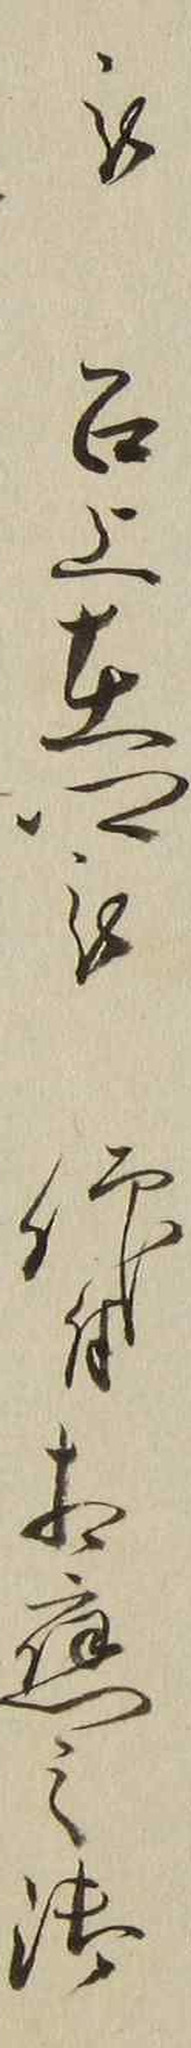被召上在郷被仰付相応之御
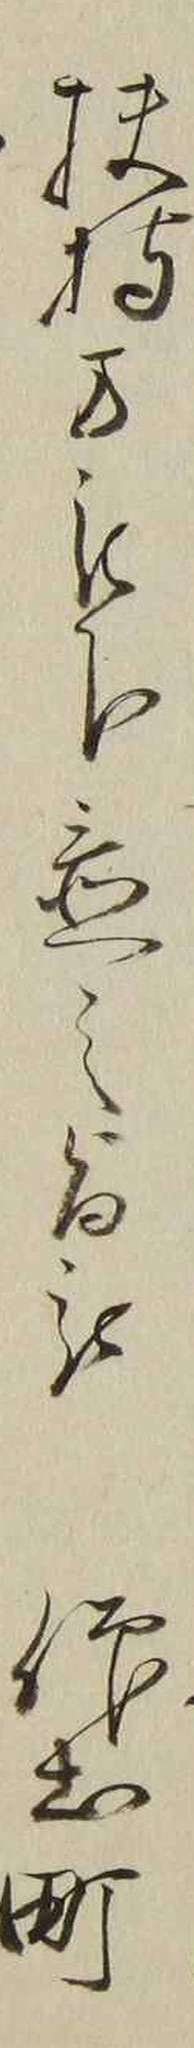扶持方被下置之旨被仰出町
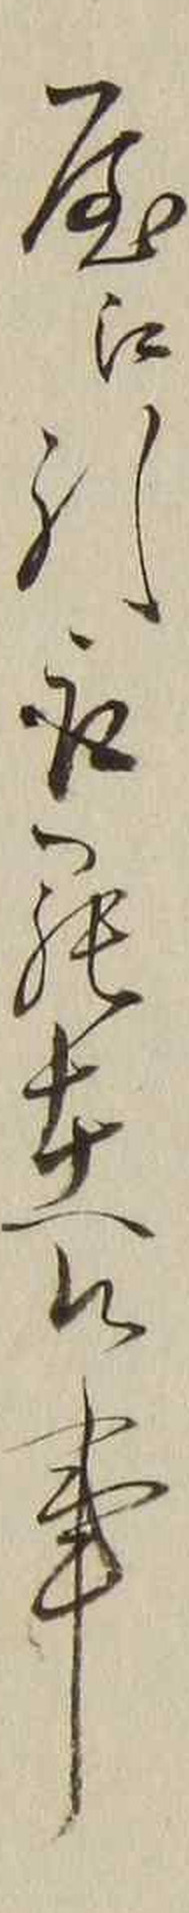屋江引取罷在候事

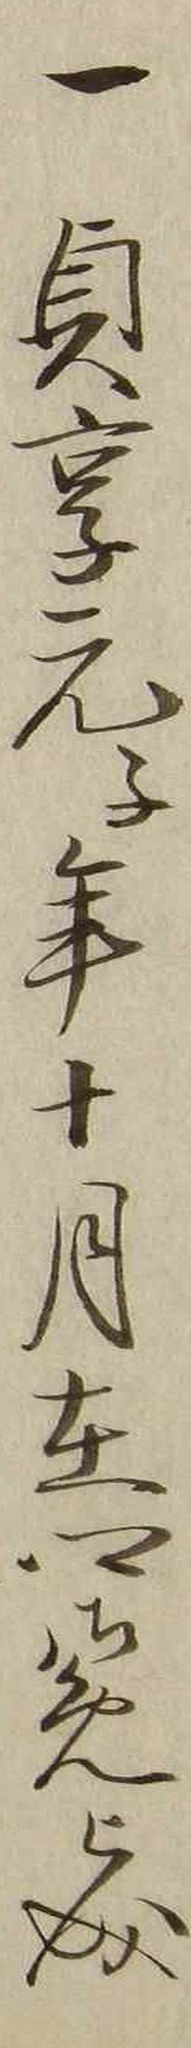一貞享元子年十月在郷御免被成
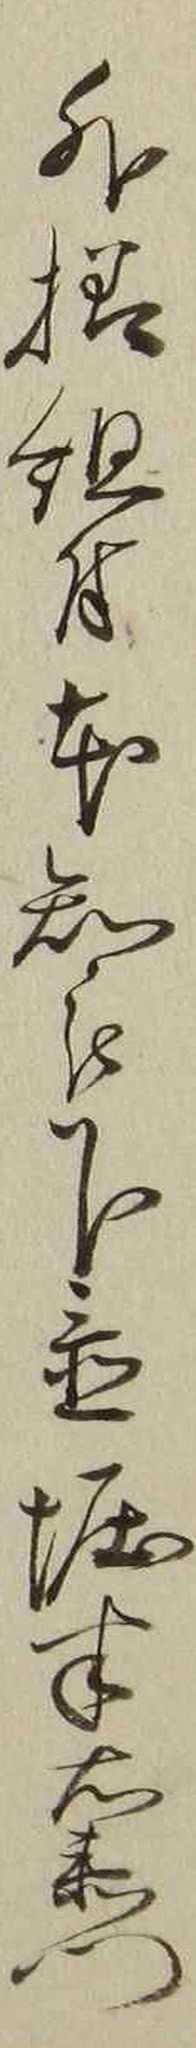外様組付本知被下置堀半右衛門
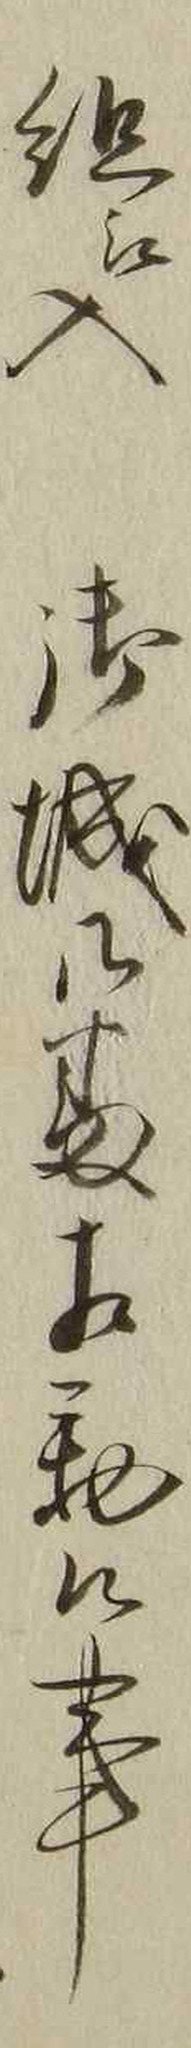組江入御城御番相勤侯事
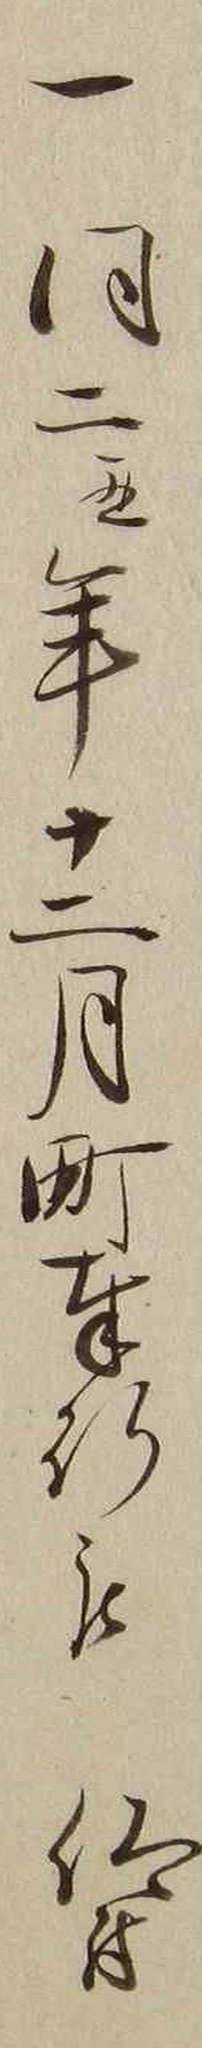一同二丑年十二月町奉行被仰付
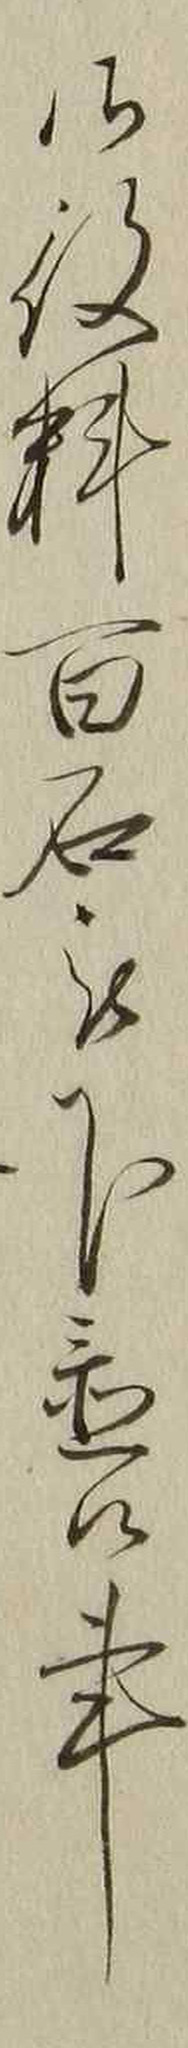御役料百石被下置候事
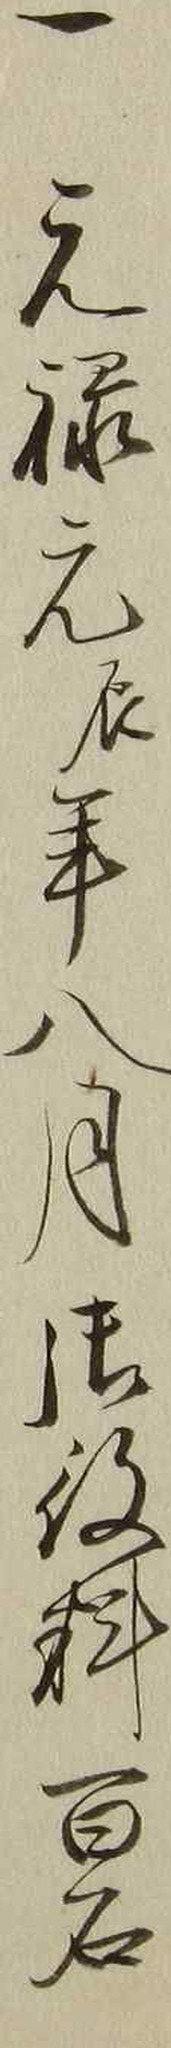一元禄元辰年八月御役料百石
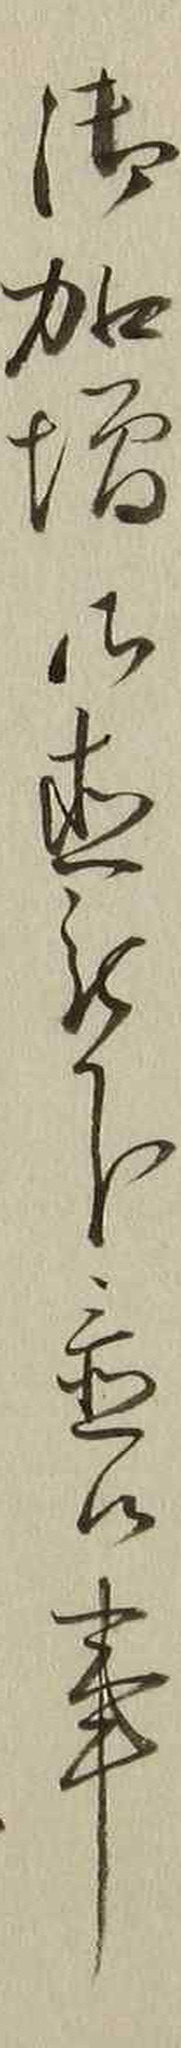御加増御直被下置候事
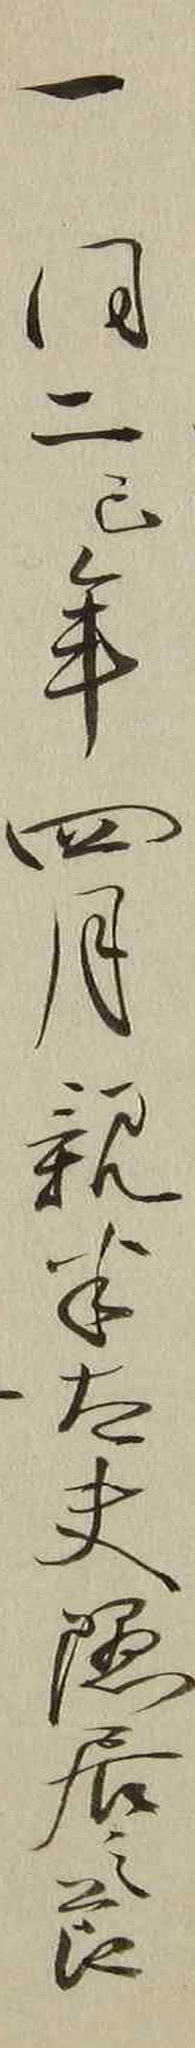一同二年己四月親半太夫隠居之節
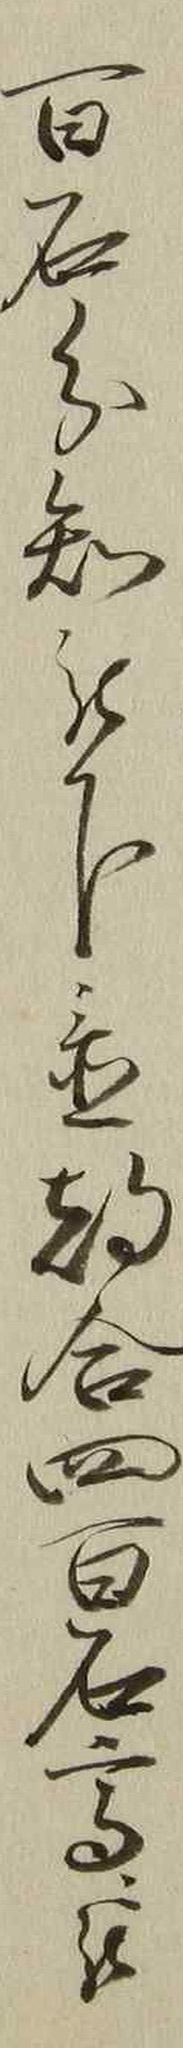百石分知被下置都合四百石高被
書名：諸士系譜　巻之103　か之部11
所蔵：会津若松市立会津図書館
